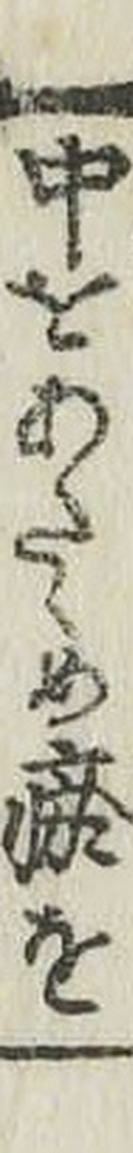中をあたゝめ瘀を
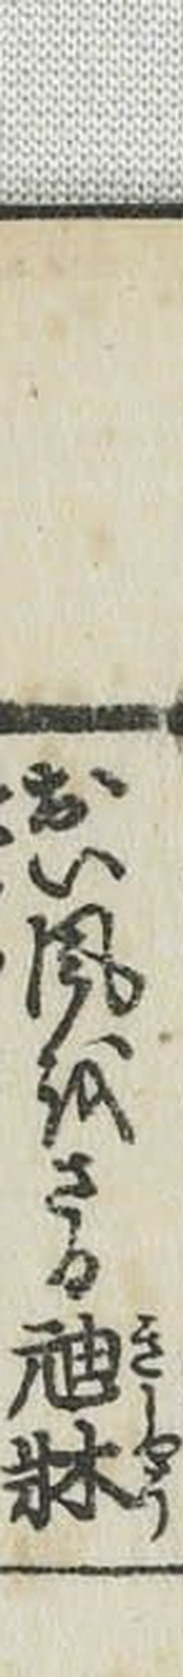おい風をさる虺牀
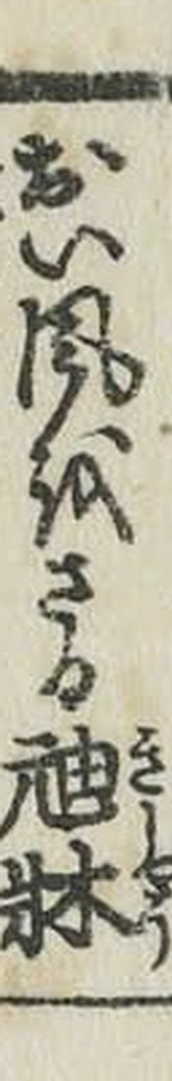おい風をさる虺牀
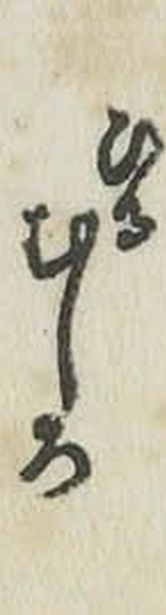ひるむしろ
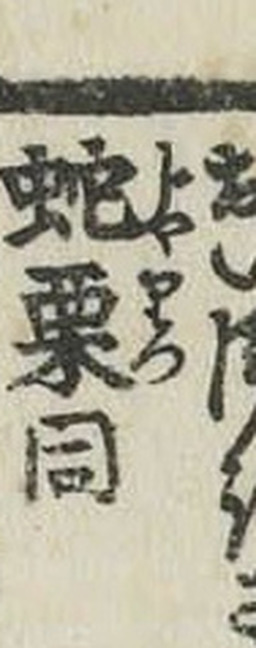蛇栗同

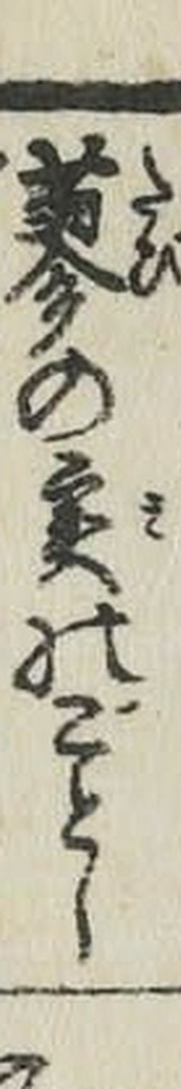蓼の実のごとし
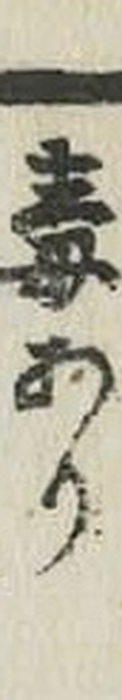毒あり
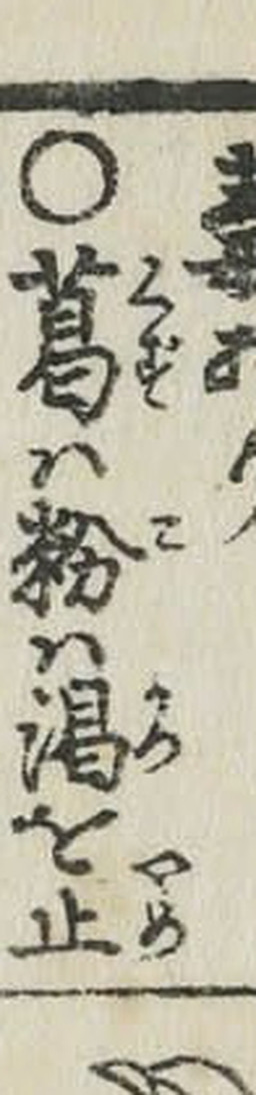○葛は粉は渇を止
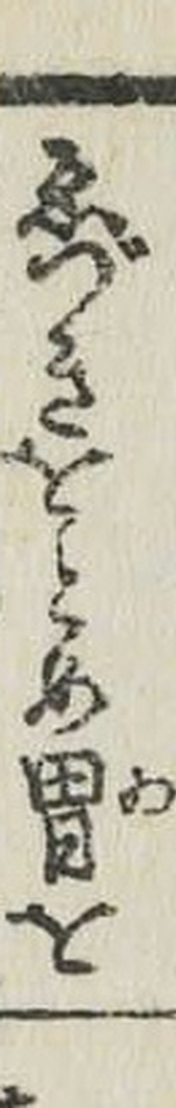ゑづきをとめ胃を
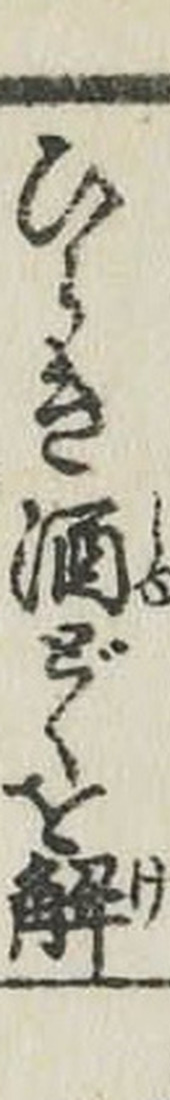ひらき酒どくを解
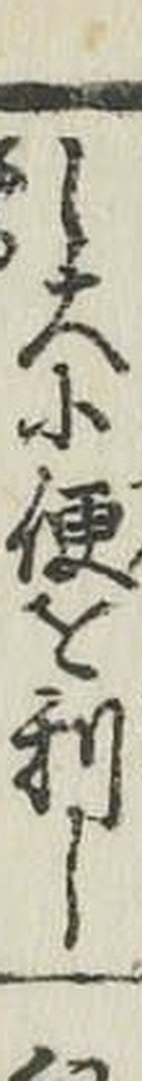し大小便を利し
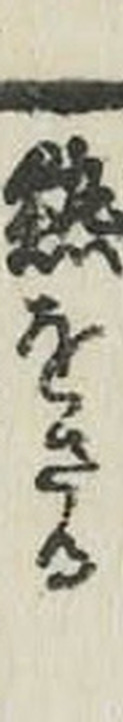熱をさる
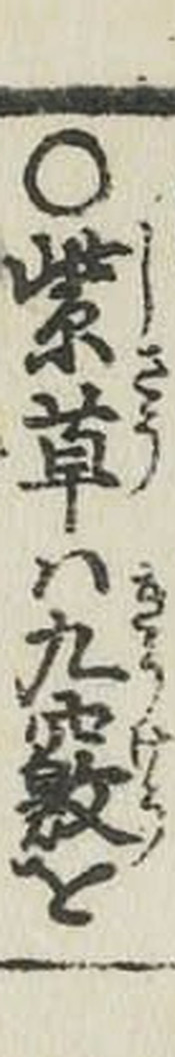○紫草は九竅を
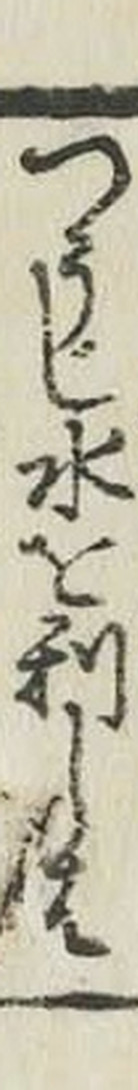つうじ水を利しは
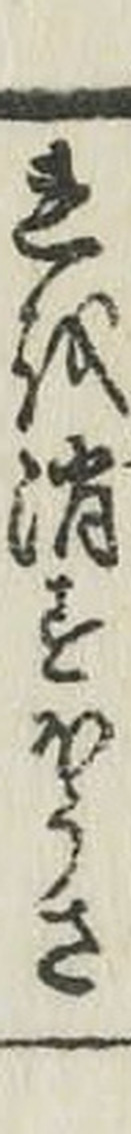れを消すほうさ
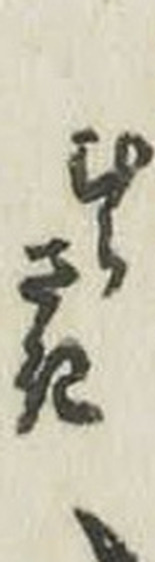むらさき
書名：増補頭書訓蒙図彙大成 10巻 9:巻之20
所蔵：東京学芸大学教育コンテンツアーカイブ
